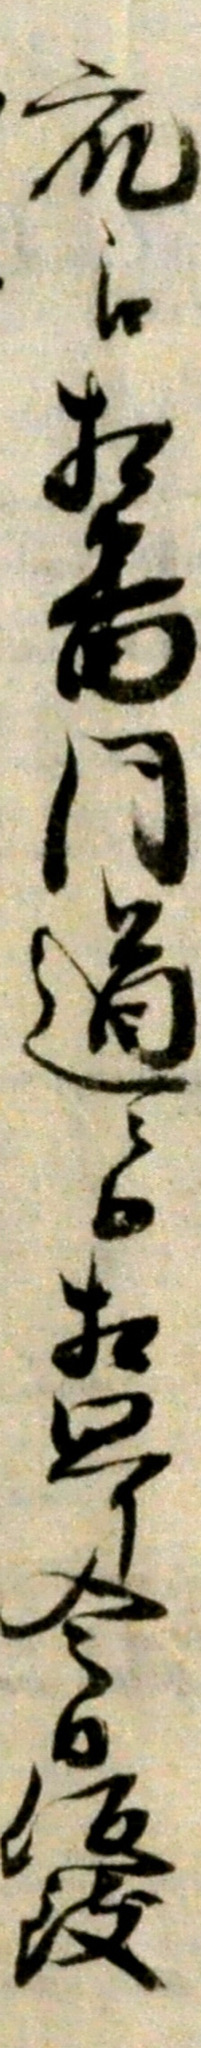衆江相番同道ニ而相廻り今日仮致
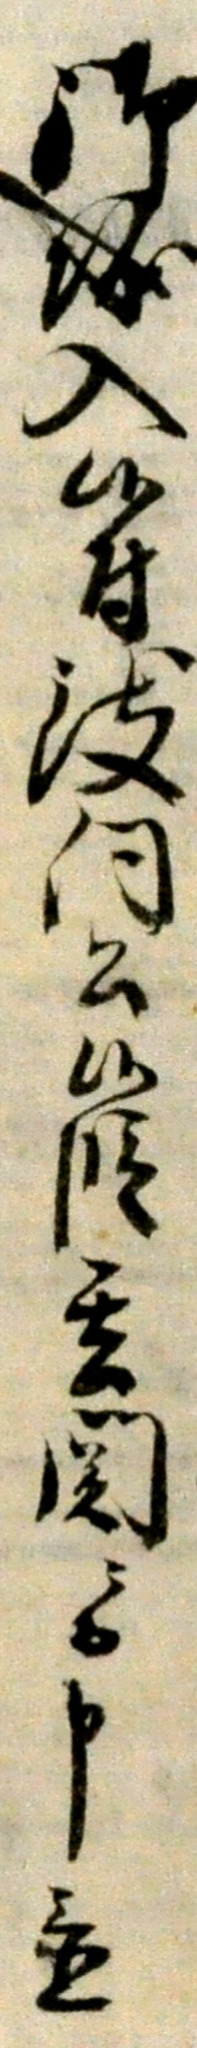御城入候付伺公候段玄関ニ而申置
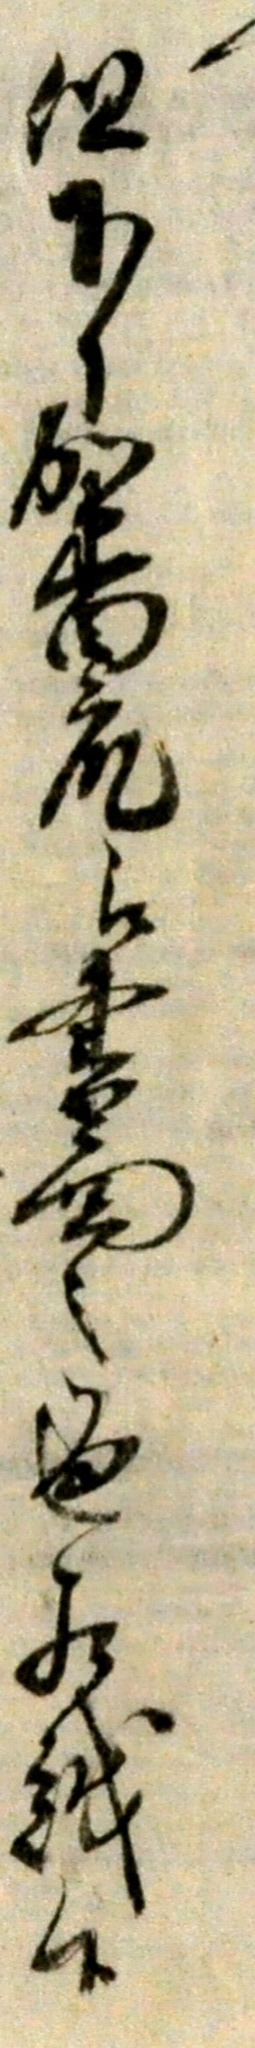但下り加番衆江書面之通相越候
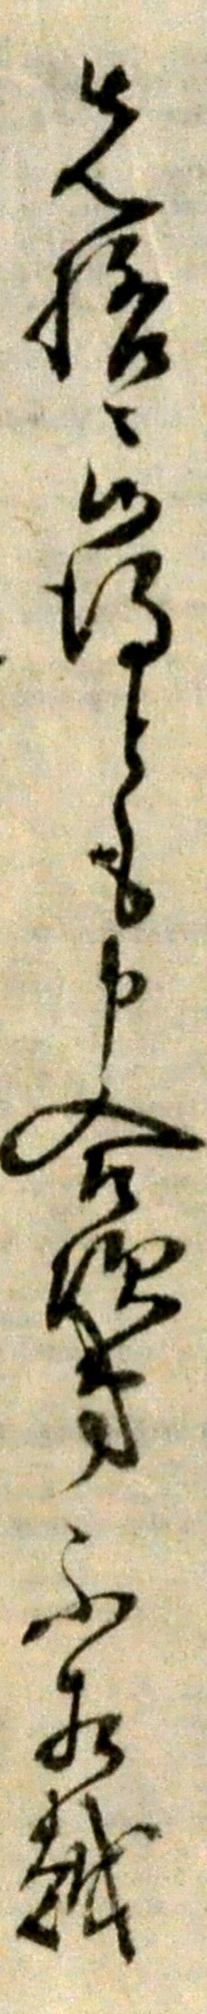先格二候得とも申合次第不相越
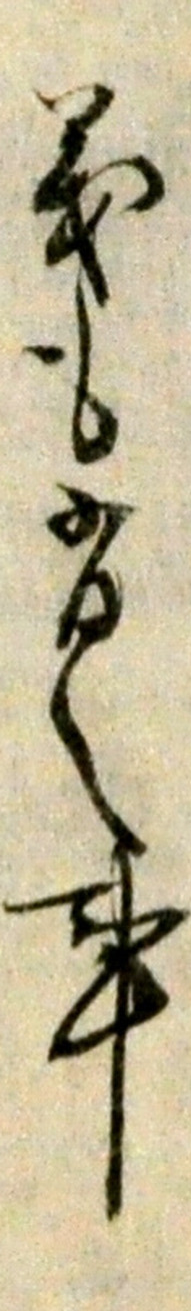義も有之事
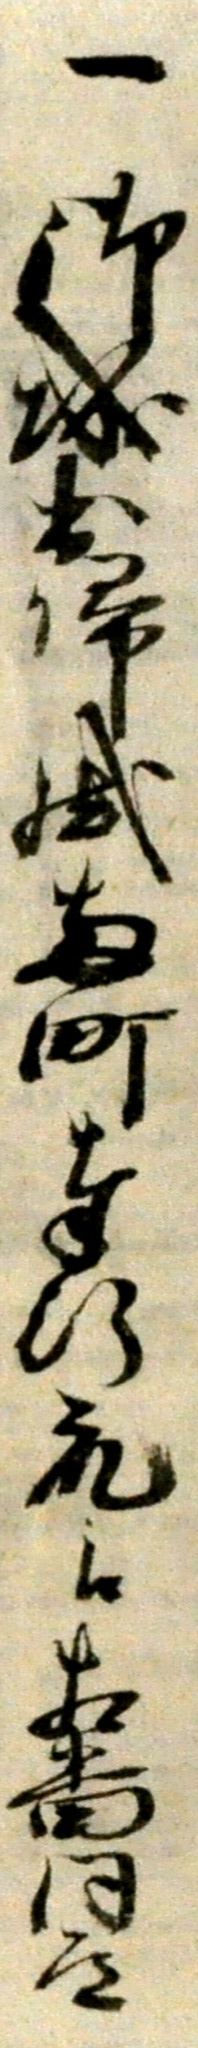一御城出帰城両町奉行衆江相番同道
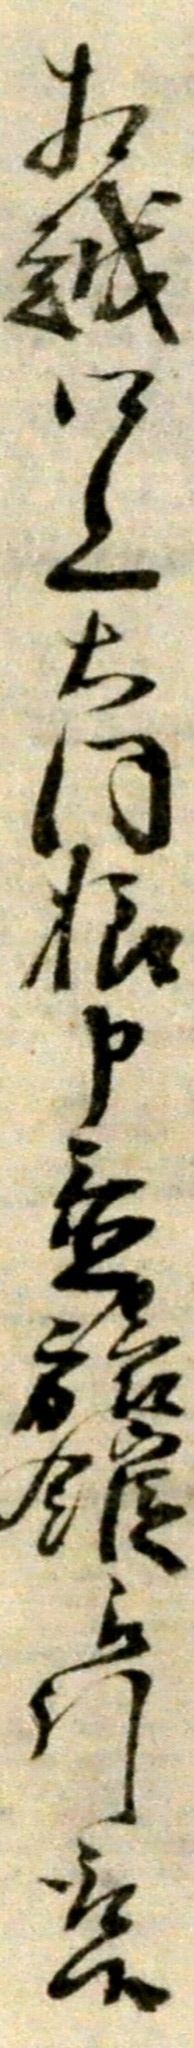相越口上右同様申置旅館江引取候
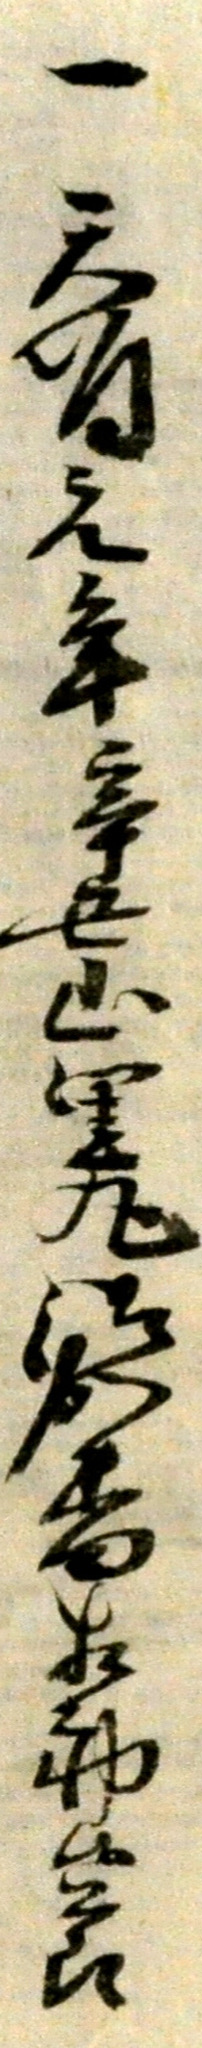一天明元年辛丑山里丸御加番相勤候節
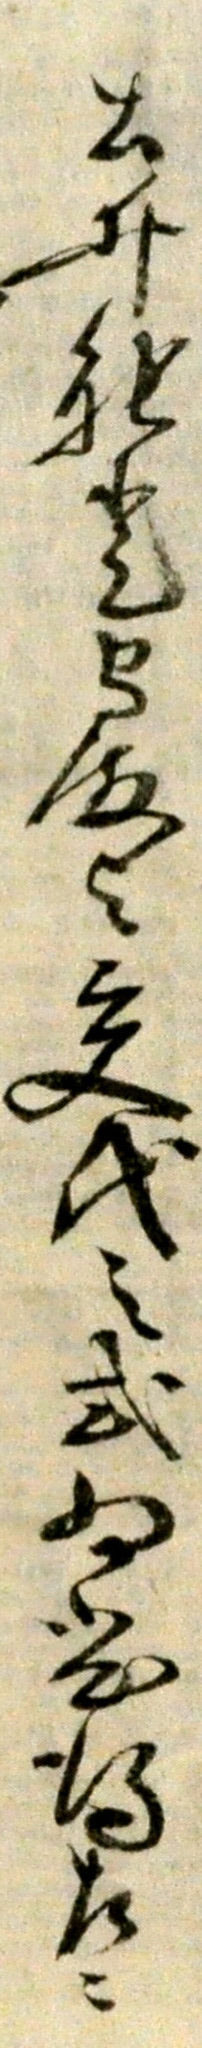土井能登守殿与交代之式為御心得左二
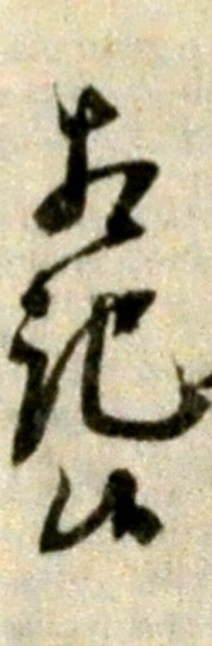相記候
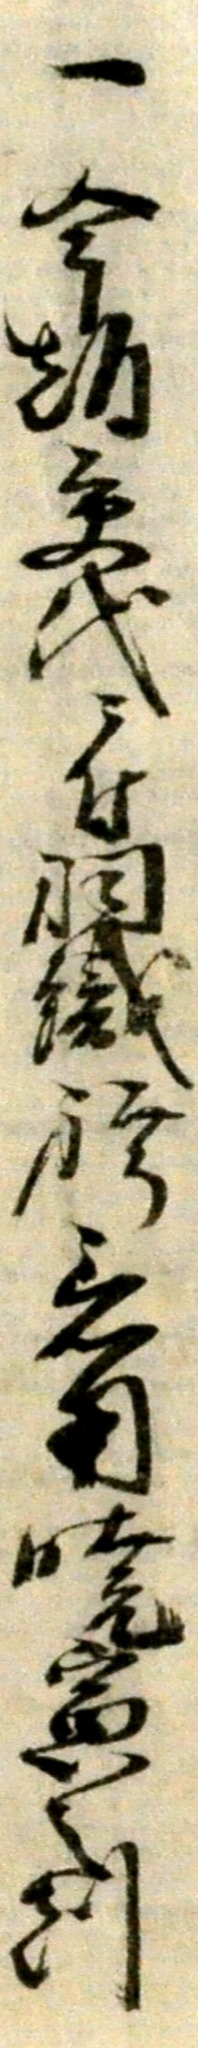一今朝更代ニ付羽織袴着用暁寅之刻
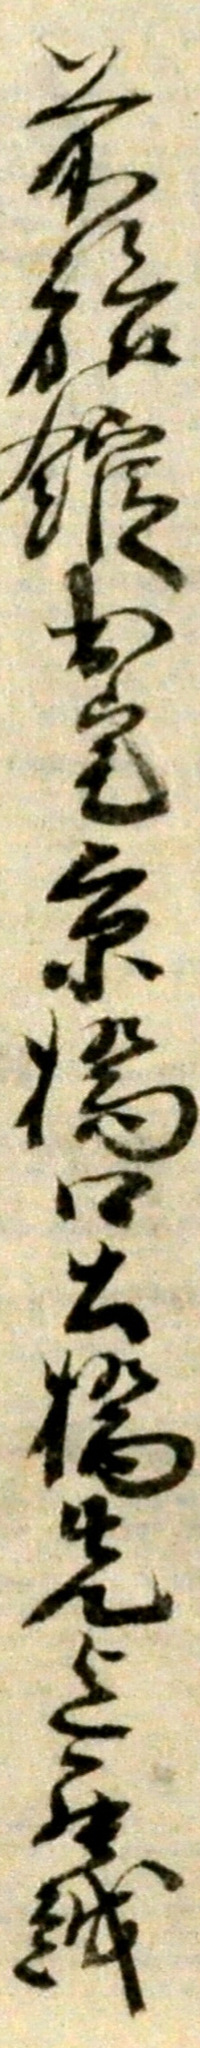前旅館出京橋口土橋先迄罷越
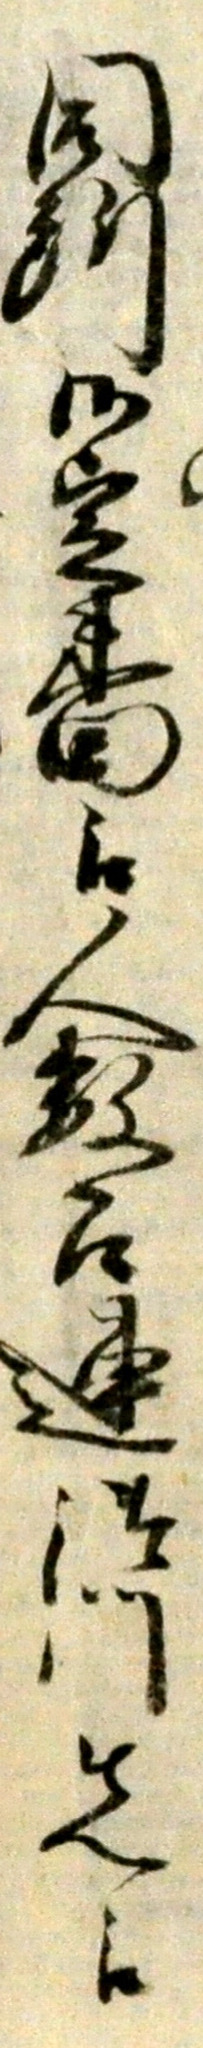同刻御定番江人数召連御門先江
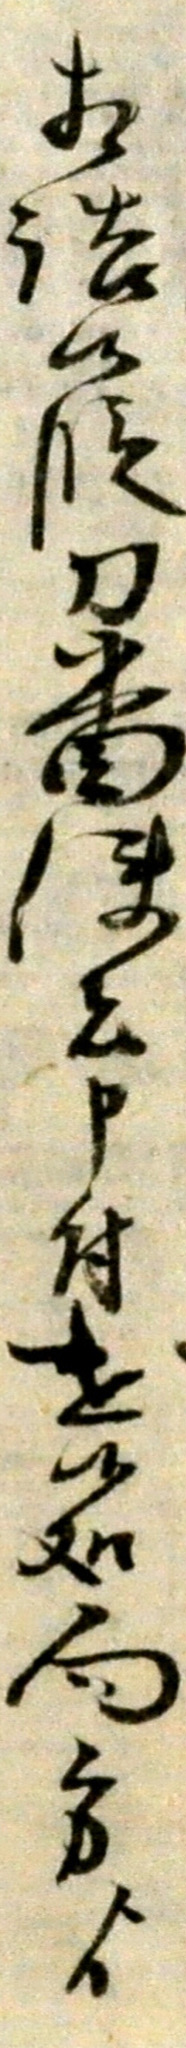相詰候段刀番使者申付遣候処向方ゟ
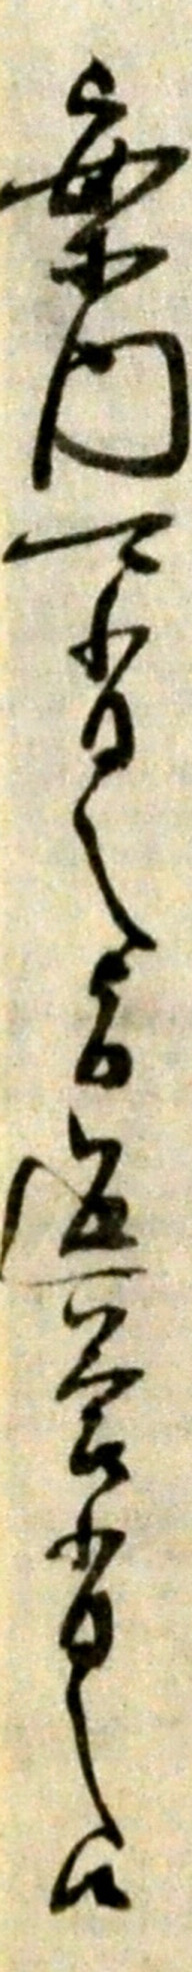案内可有之旨返答有之候
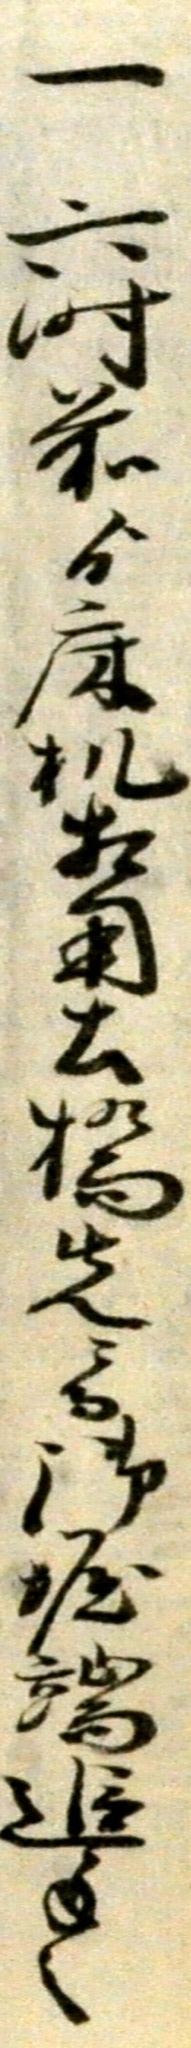一六時前ゟ床机相用土橋先ニ而御堀端追手之
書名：大阪加番関係諸書留〔一括〕
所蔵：伊那市立高遠町図書館・合同会社AMANE
